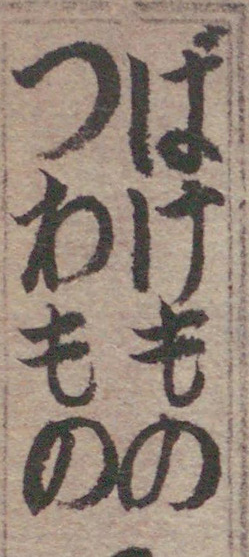つわもの
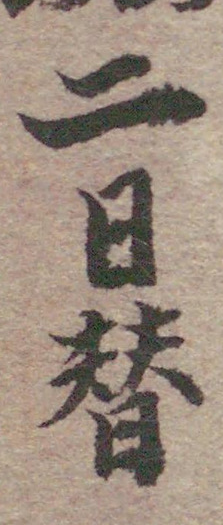二日替

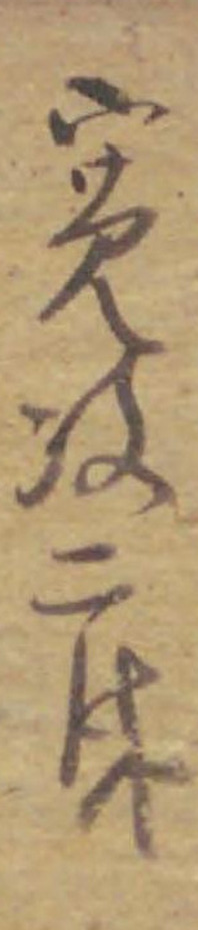寛政二年

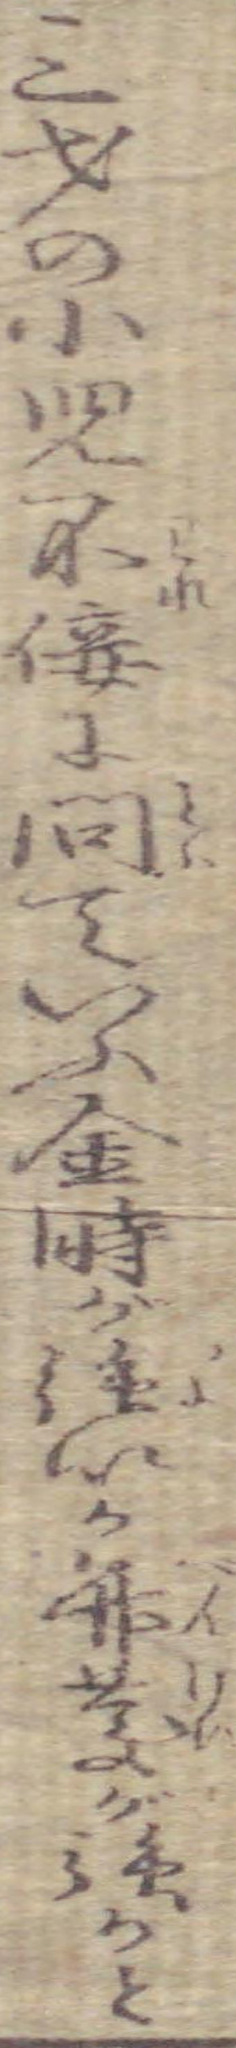三才の小児不俏に問ていふ金時が強いか弁慶が強かと
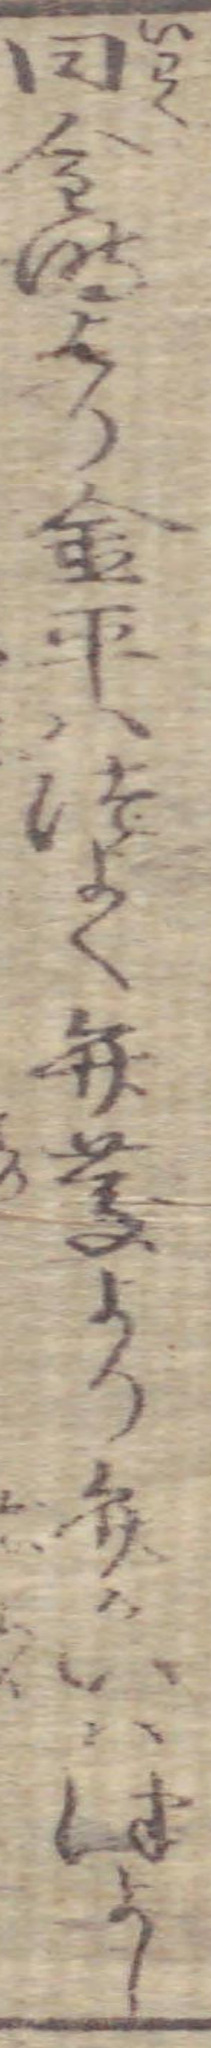日金時より金平はつよく弁慶より弁かいはつよし
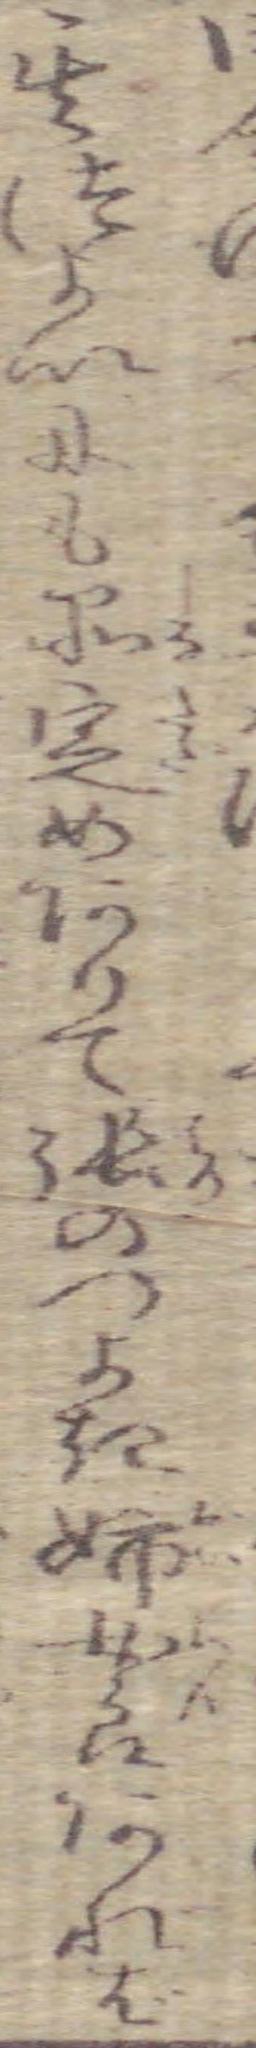其つよいにも品定めありて張のつよき姉女郎なれば
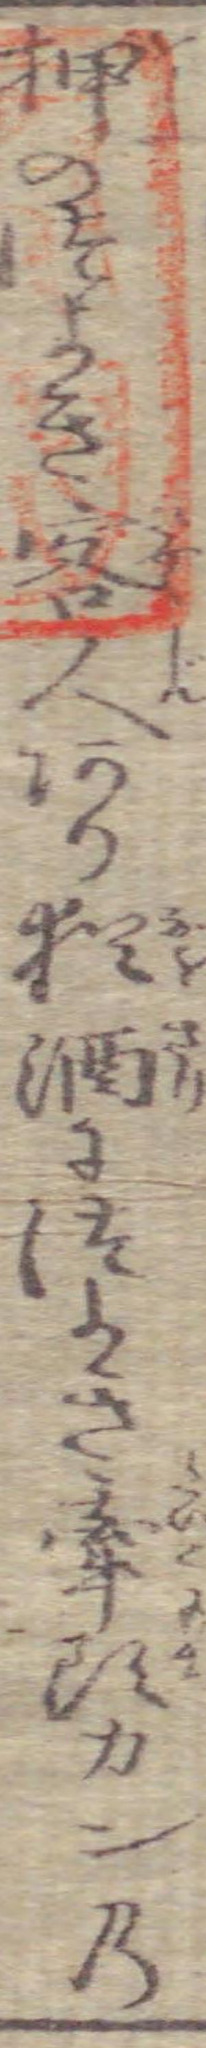押のつよき客人あり猶酒につよき牽頭カンの
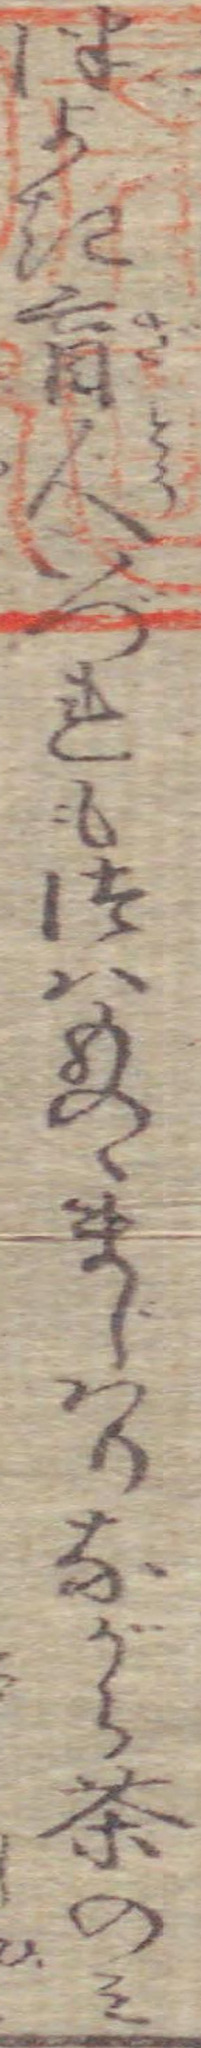つよき盲人いづれもつはものゝまじはりながら茶のみ
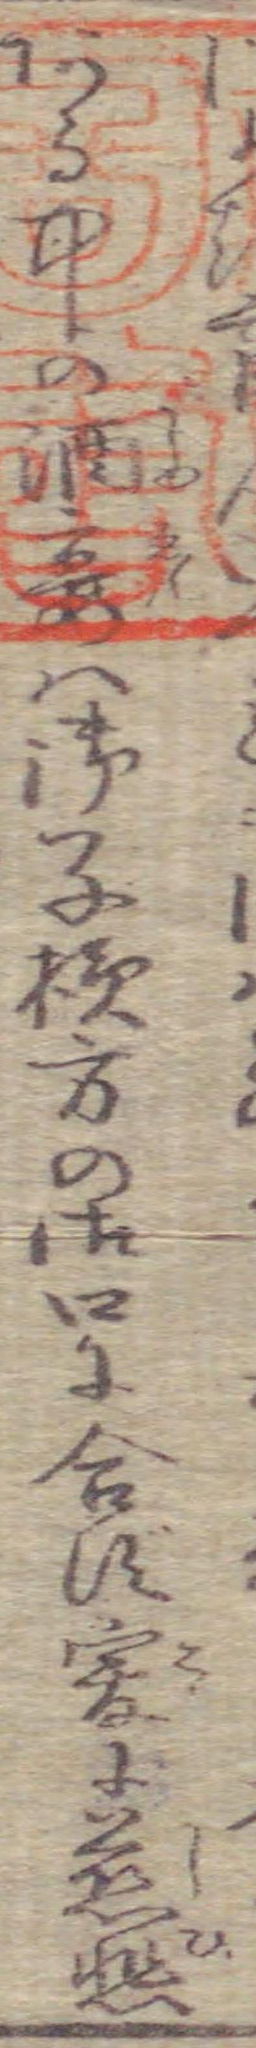ある中の酒宴は御子様方の御口に合ず爰に慈悲
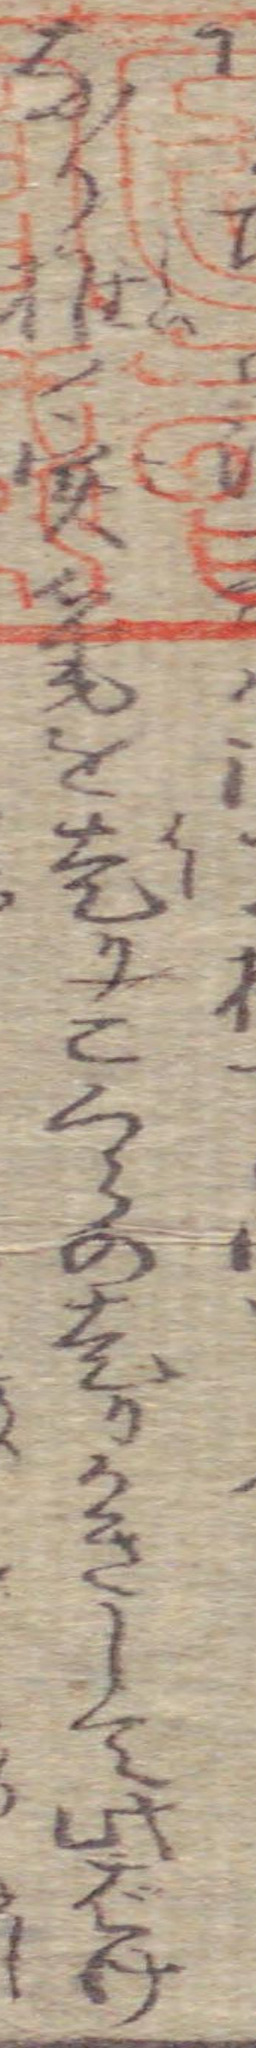なり椎の実筆を走りこくらの走りかきして此ばけ
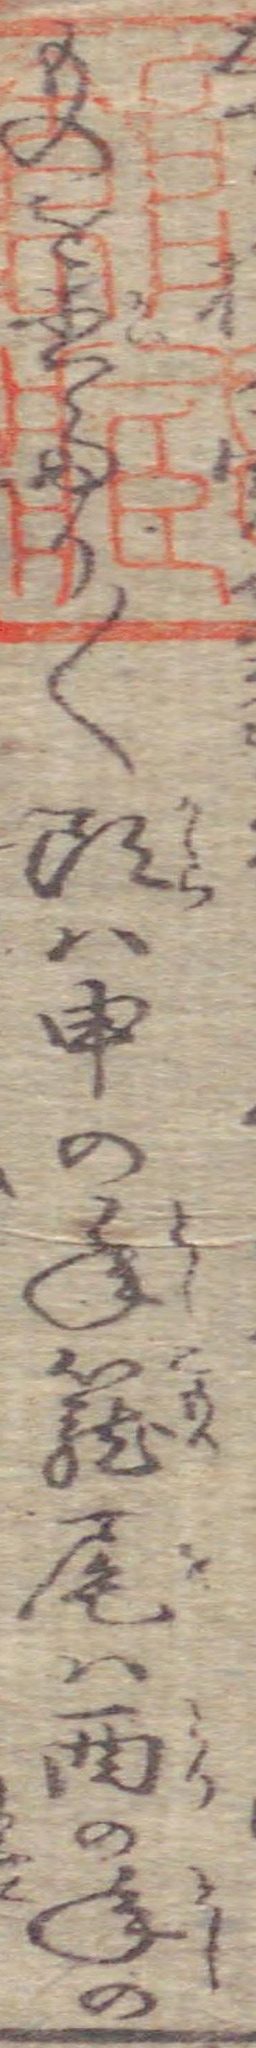ものを書たり〳〵頭は申の年籠尾は酉の年の
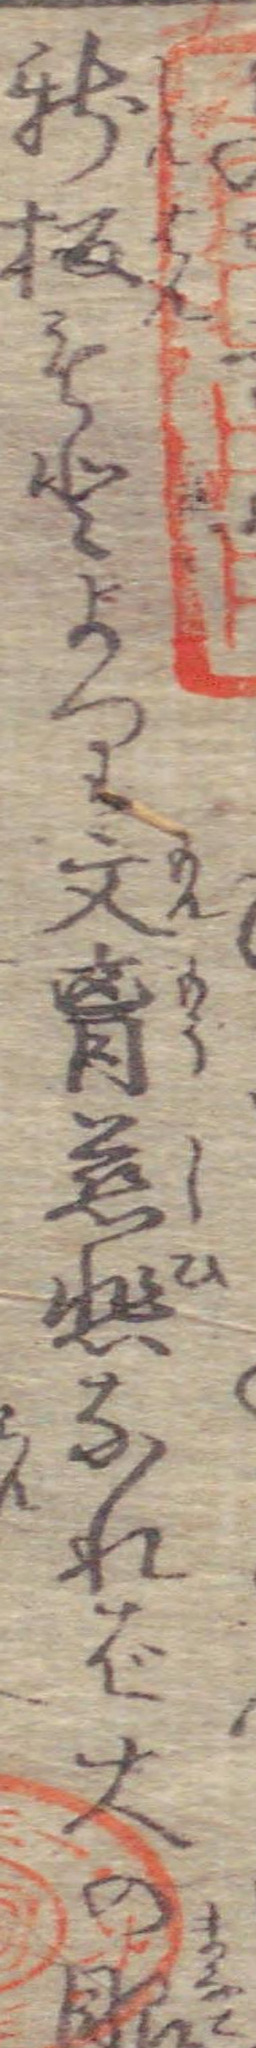新板もとより文盲慈悲なれば大の眼を
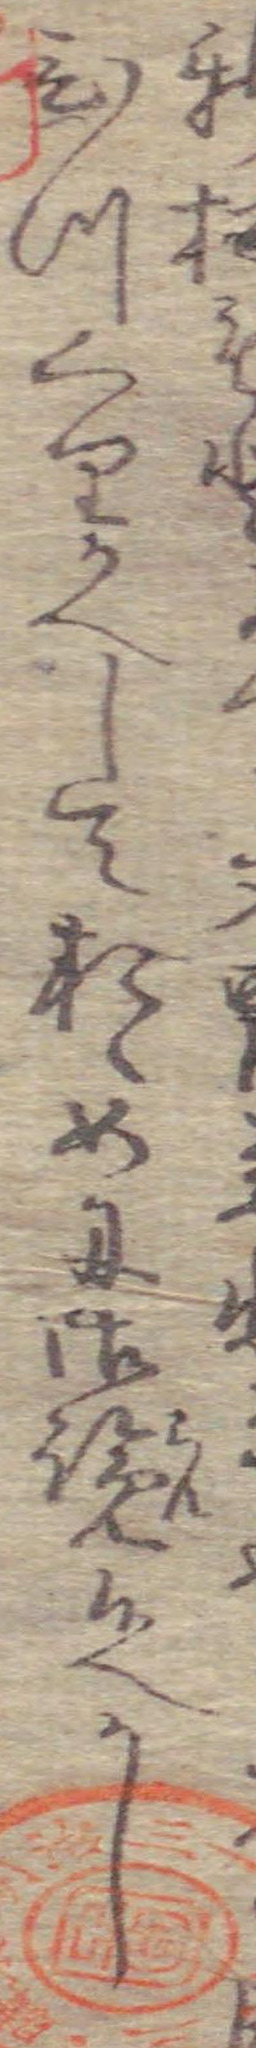ひつくりかへしておゝめに御覧候へかし
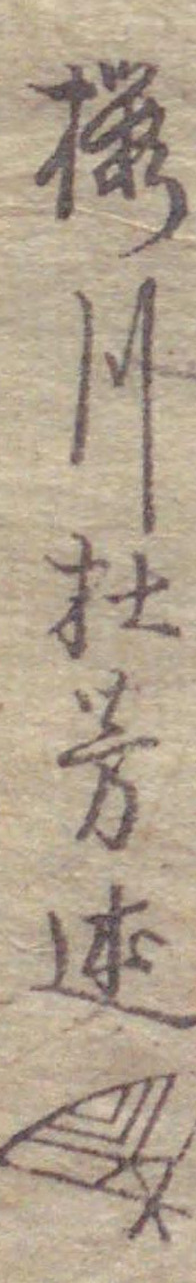桜川杜芳述

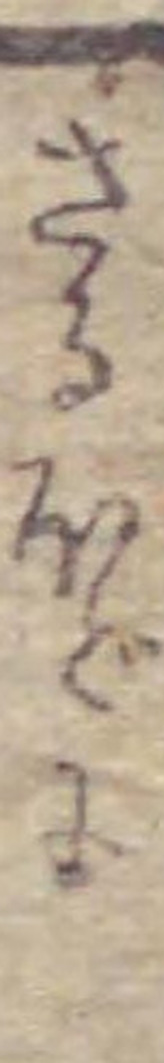さるほどに
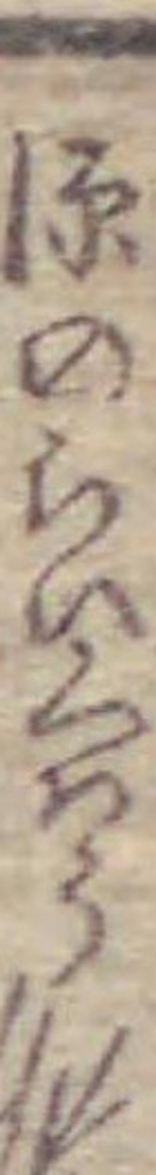源のらいくはう
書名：二日替 : 2巻
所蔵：国立国会図書館 National Diet Library, JAPAN
